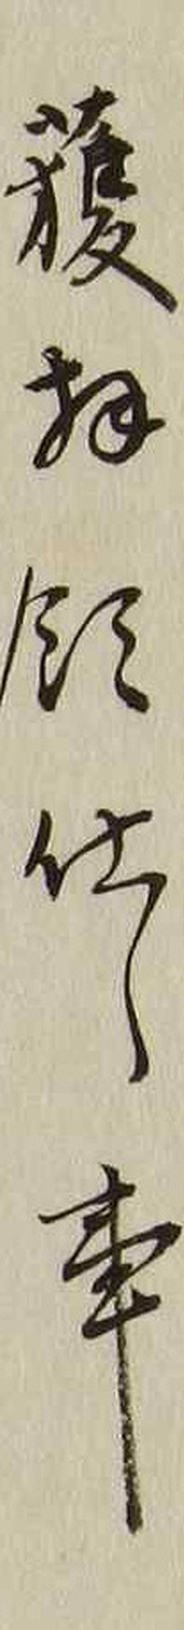獲物領仕り候事
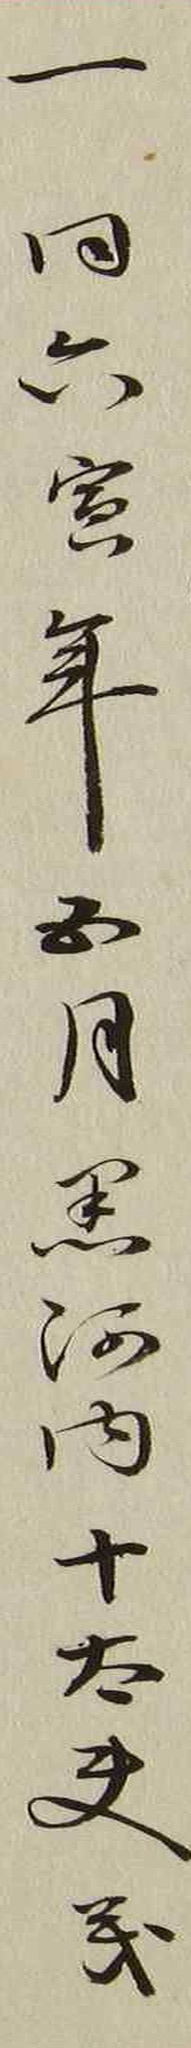一同六寅年五月黒河内十太夫義
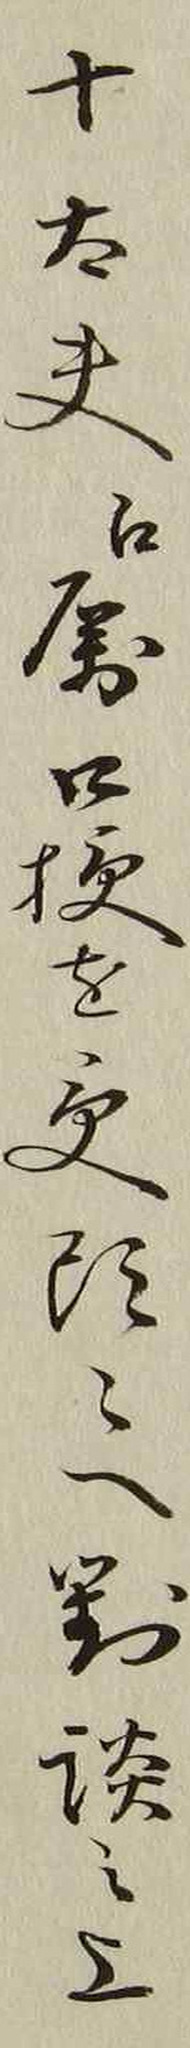十太夫へ属口授を受け頭々へ則談之上
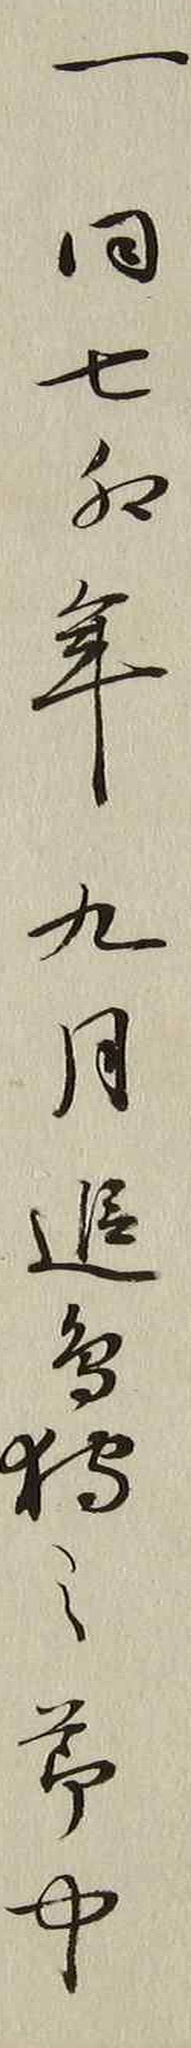一同七卯年九月追鳥狩之節中
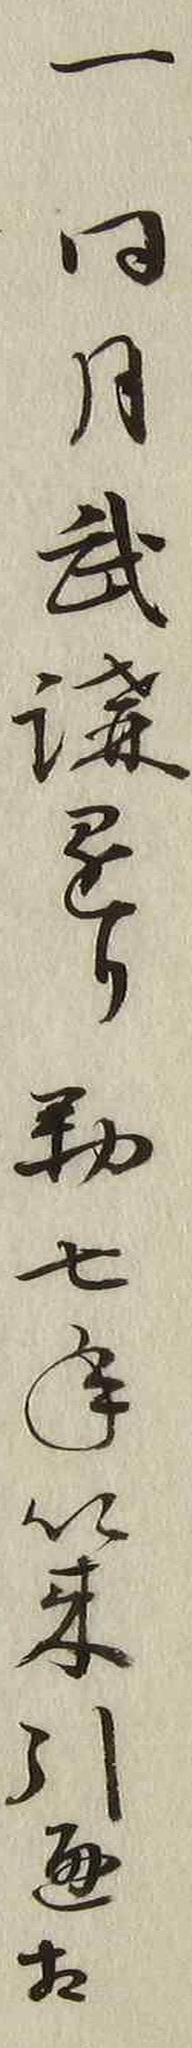一同月武講懸り勤め七年以来引通し相
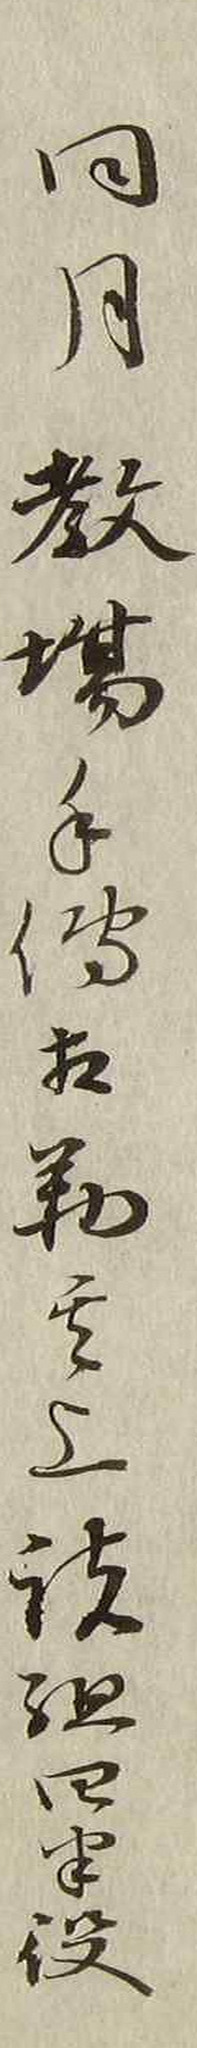一同月教場手伝い相勤其上諸組四半役
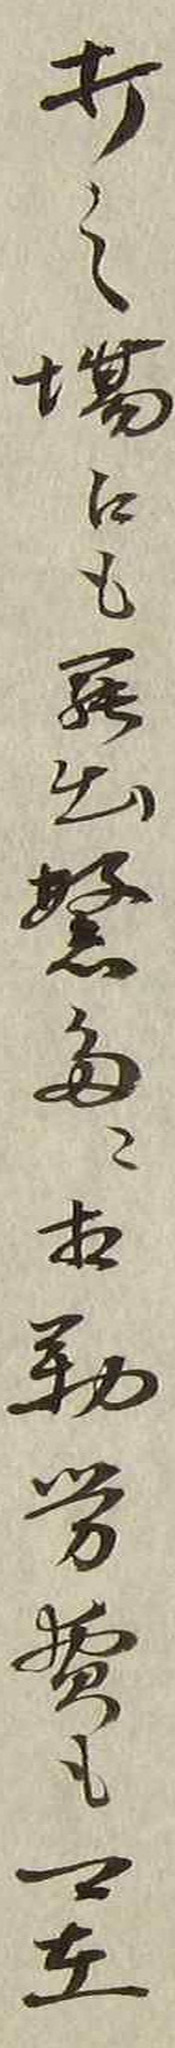打之場にも罷り出で繁多ニ相勤労費もこれ

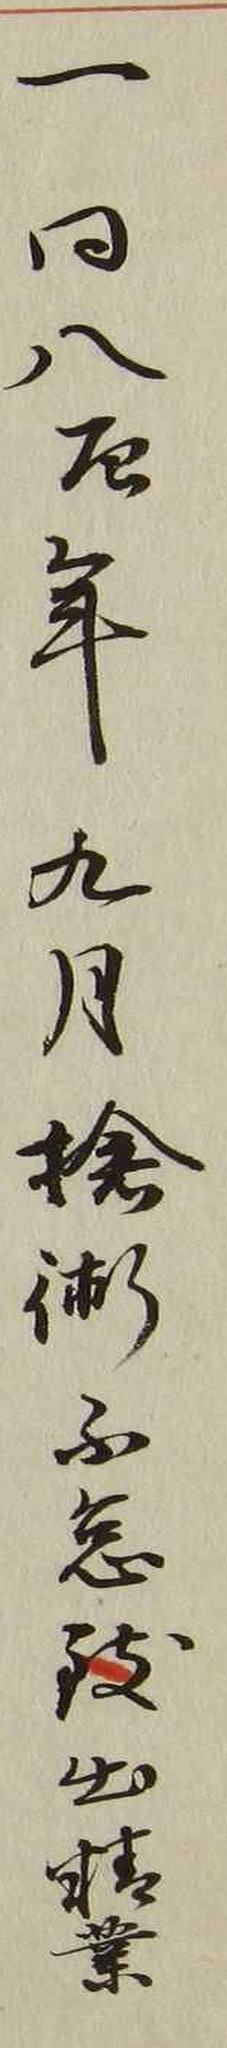一同八辰年九月槍術怠らず出精致し業
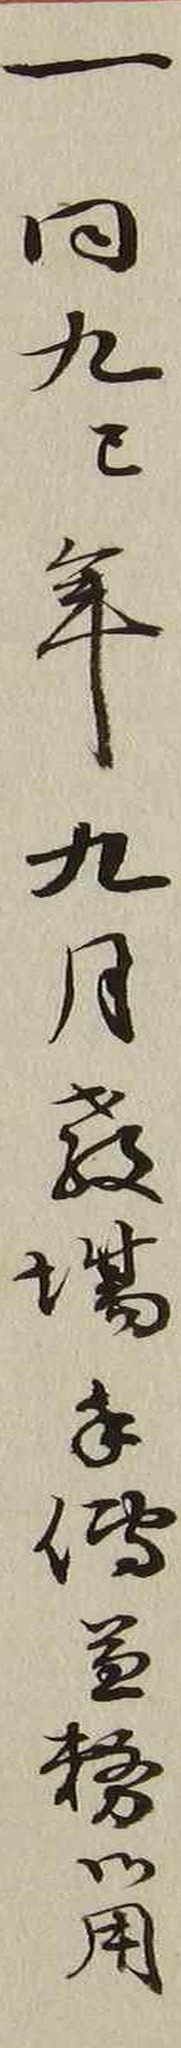一同九巳年教場手伝い兼務御用
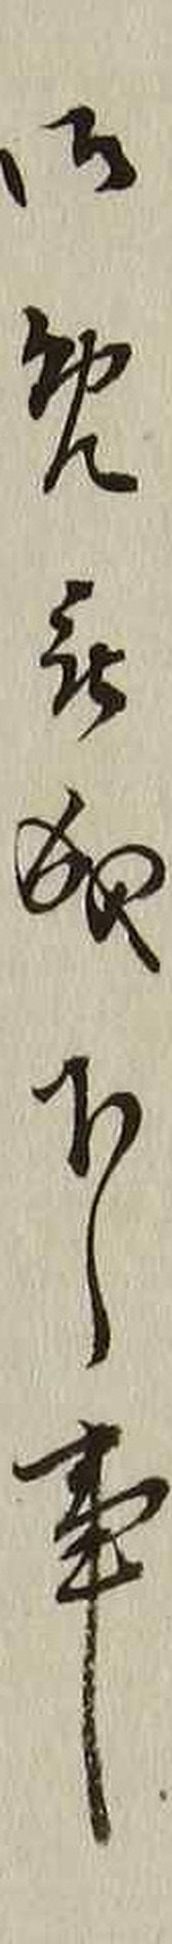御免成下され候事
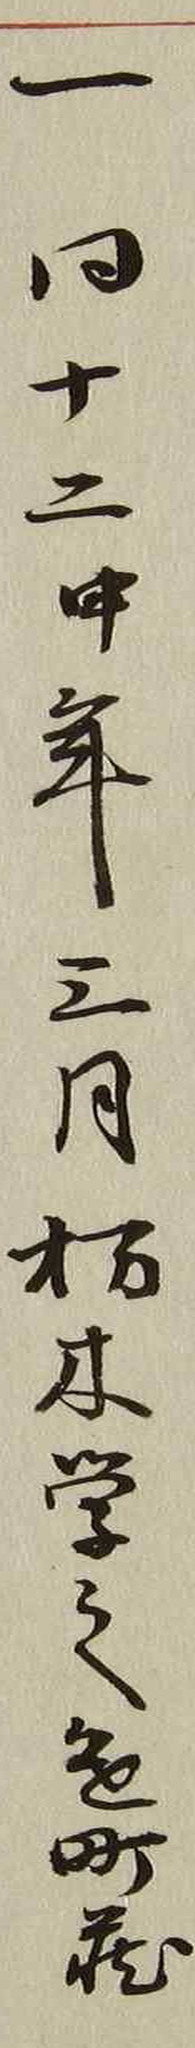一同十二申年三月朽木学之進町蔵
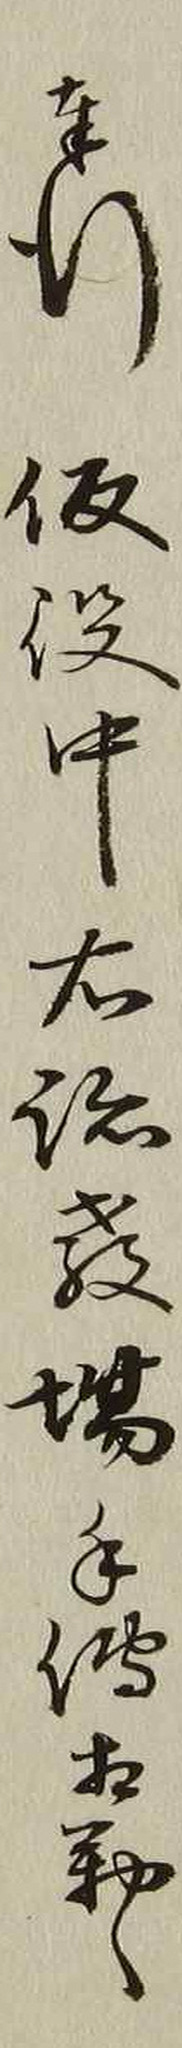奉行仮役中右諸教場手伝い相勤め候
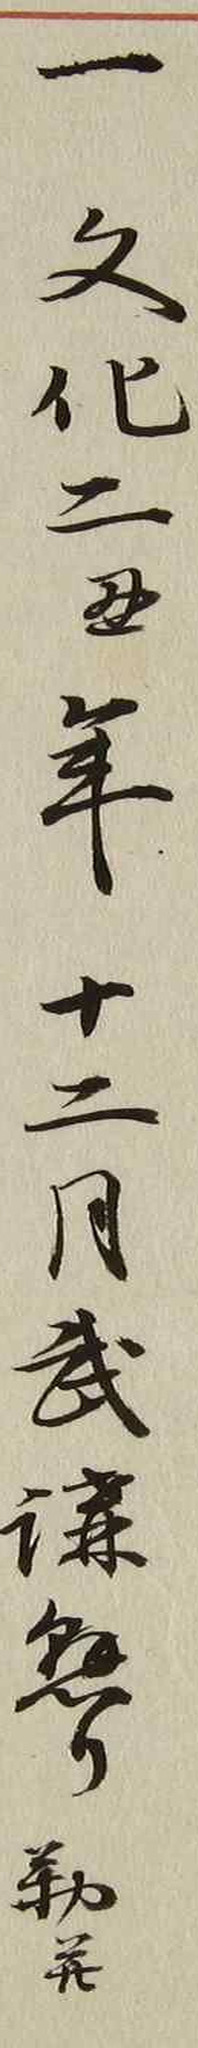一文化二丑年十二月武講懸り勤め幷
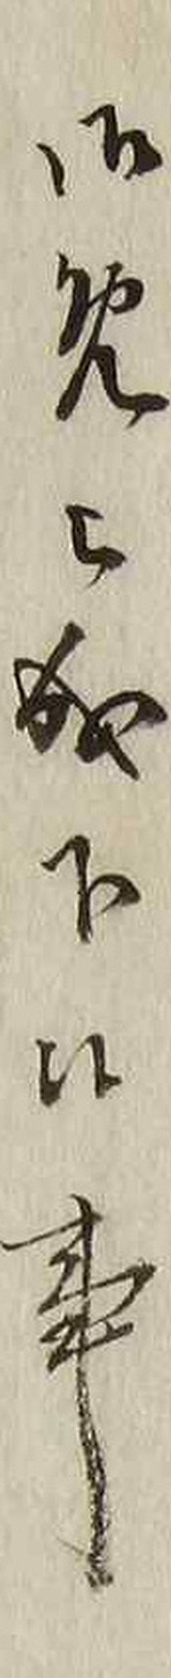御免成下され候事
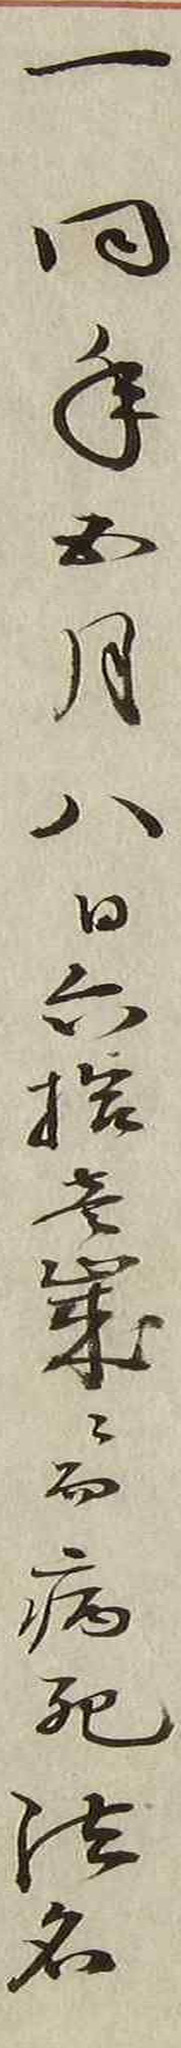一同年五月八日六拾壱歳ニて病死法名
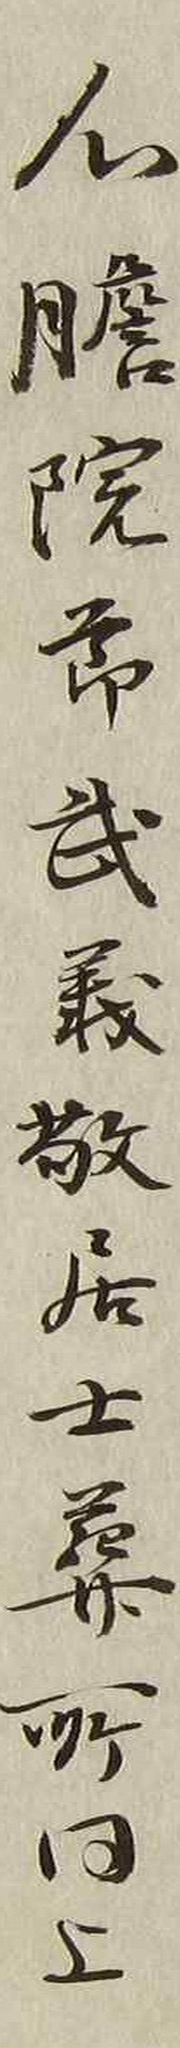心膽院節武義敬居士葬所同上
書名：諸士系譜　巻之16　い之部16
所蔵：会津若松市立会津図書館
